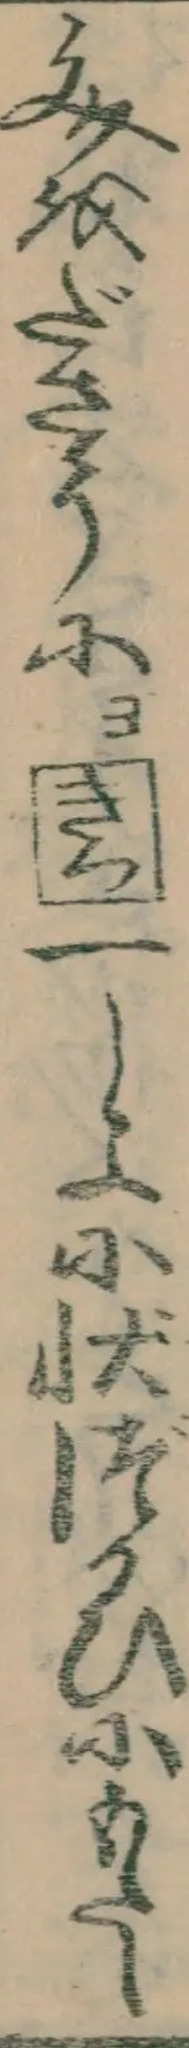文をださうにヨ〈きつ〉一しよに状づかひにもたし
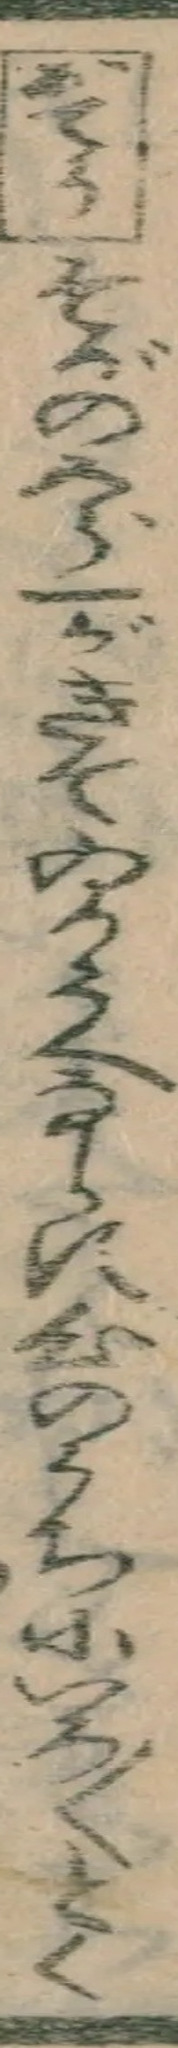〈おてう〉そがの五郎一がきてゐる？うへならす心のうちにいろ〳〵とく
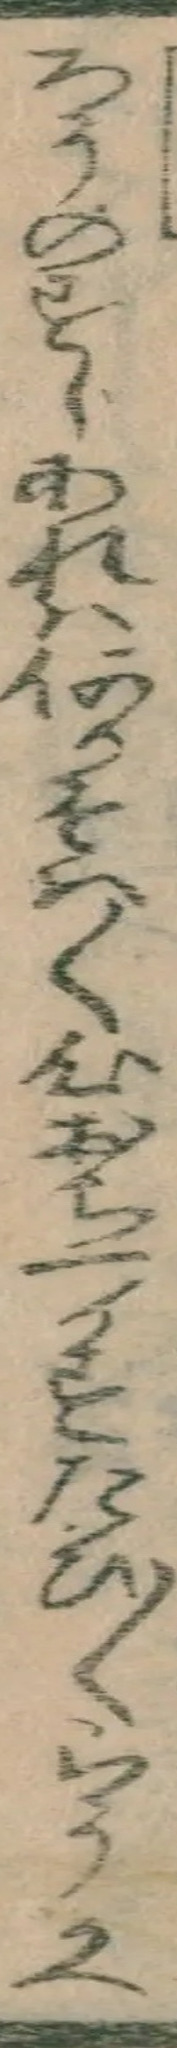ろうのすじあれは何かそは〳〵心おちつかすたひ〳〵らうかへ
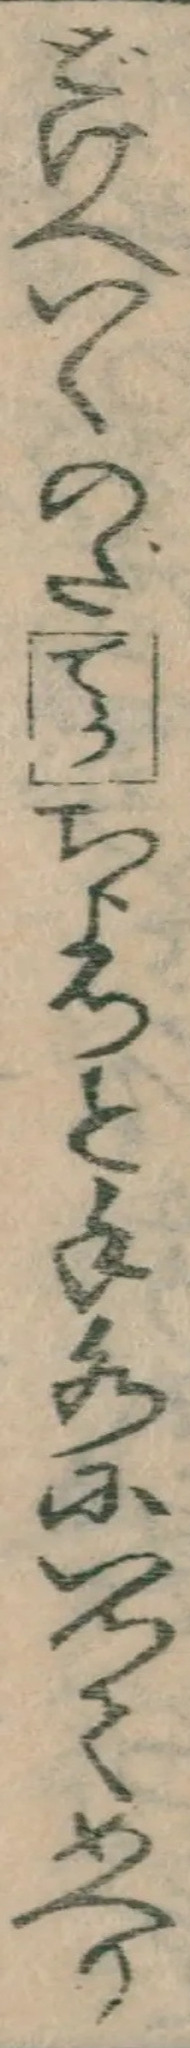どけへいくのだ〈てう〉ちよつと手水にいつてめへり
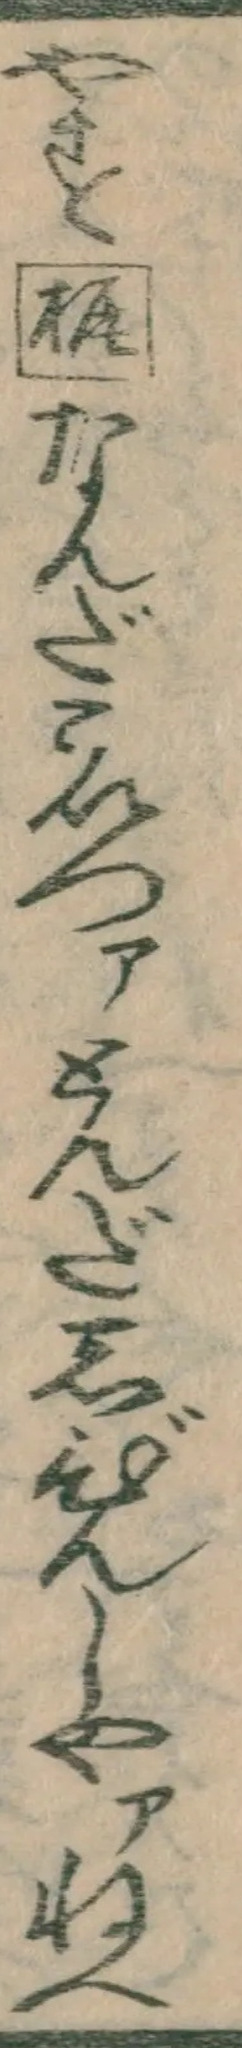やす〈梶〉なんだこいつァとんだしびんしやァねへ
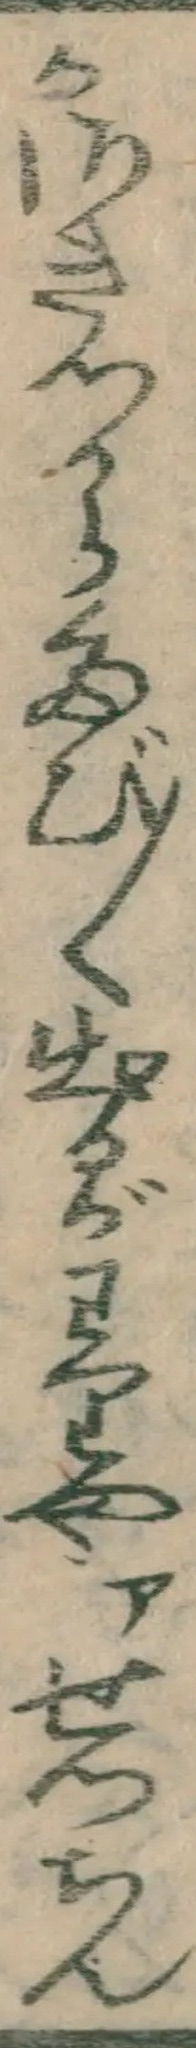かさきつからたび〳〵出るがわりやァせつちん
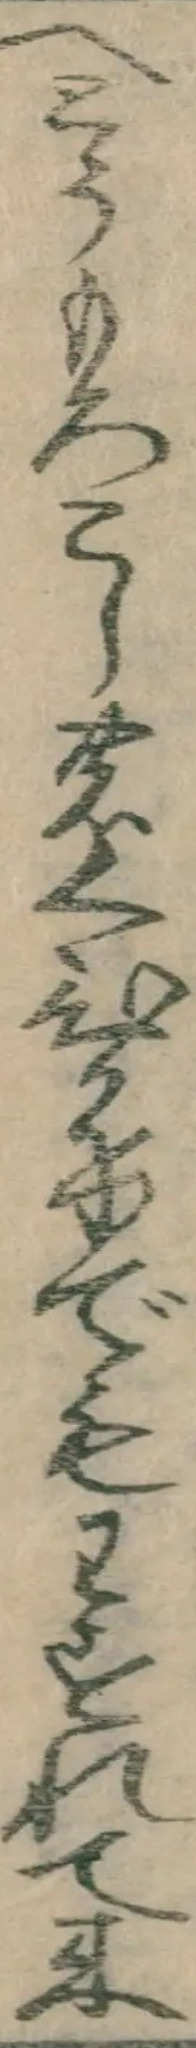へとうもろこしのひきかけでもわすれて来
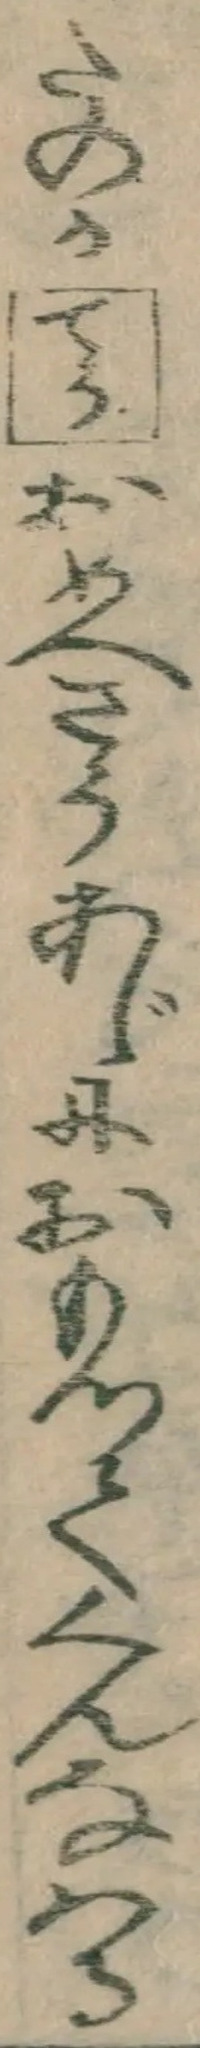たのか〈てう〉おめへさうあじにおもつてくんなはる

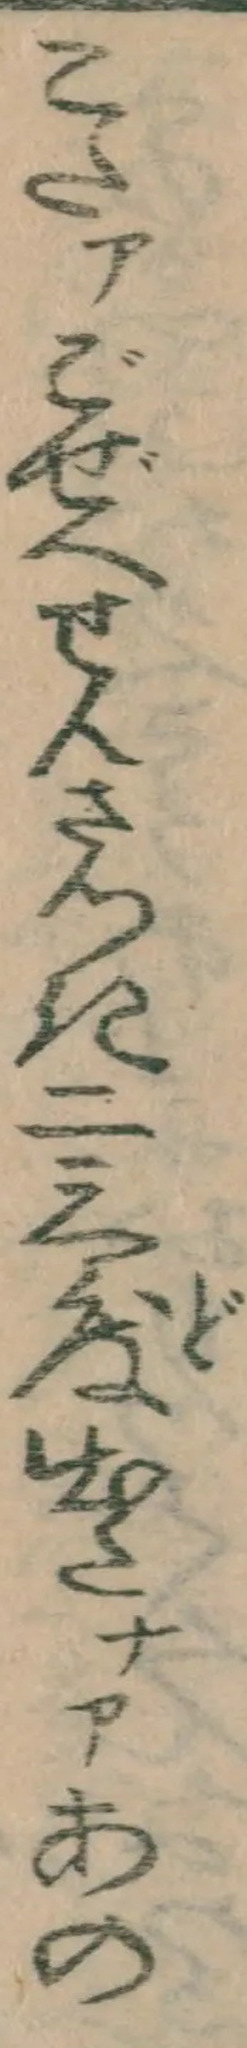こたアばぜへせんさつき二三度出たナアあの
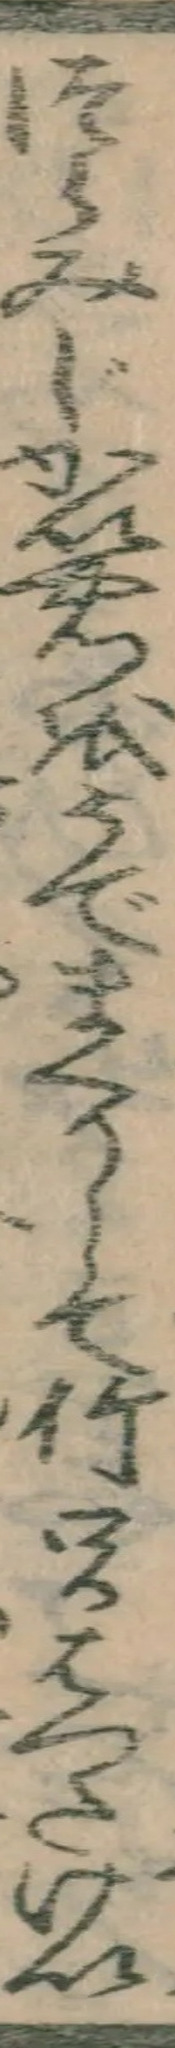つらみじかいやつをうでまくりして竹口かはつたけい
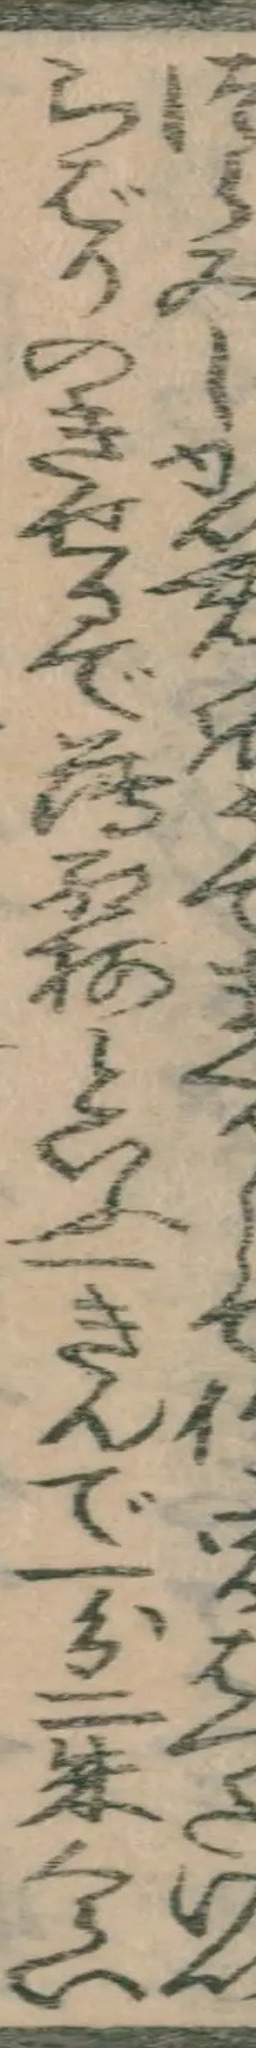らばりのきせるで薄紅梅といふ一きんで一分二朱くらい
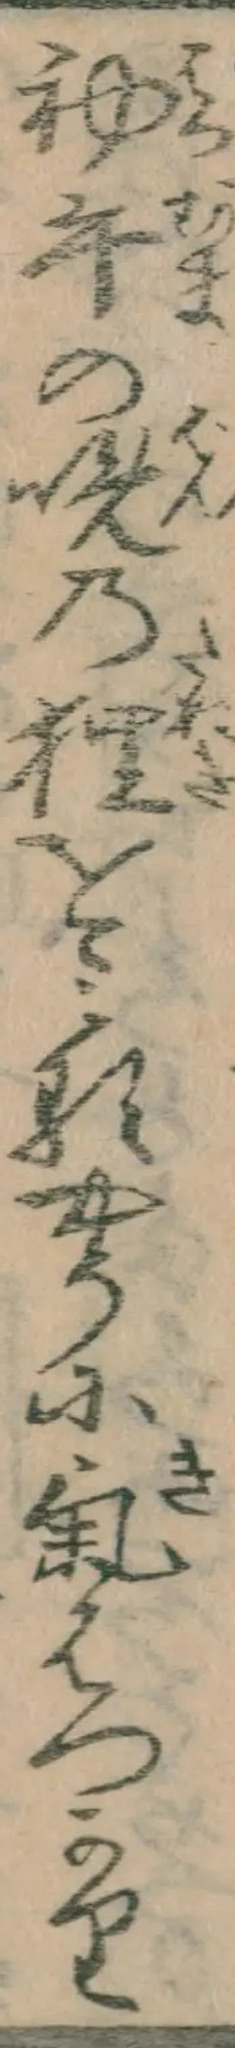初午の晩の狸をみるやうに気はつかり
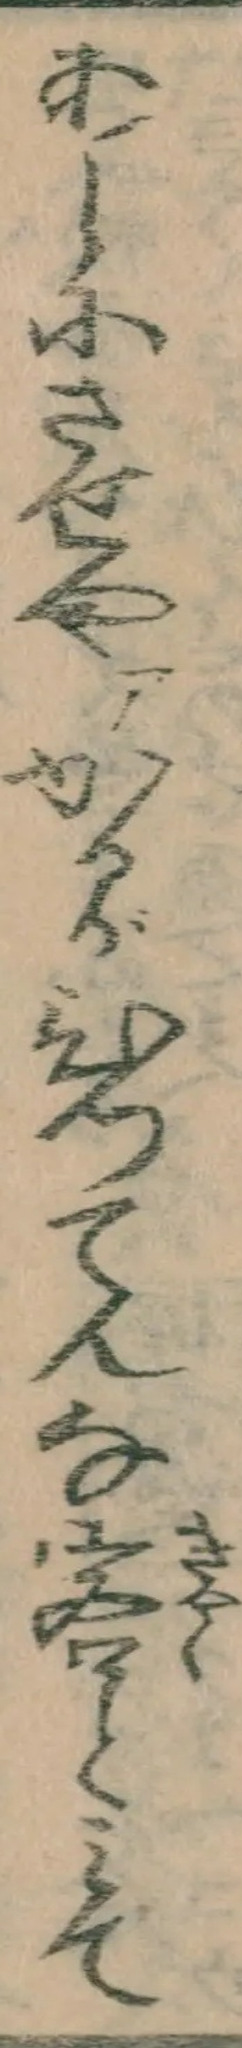あしにさせやァかるがひつてんな客とみて
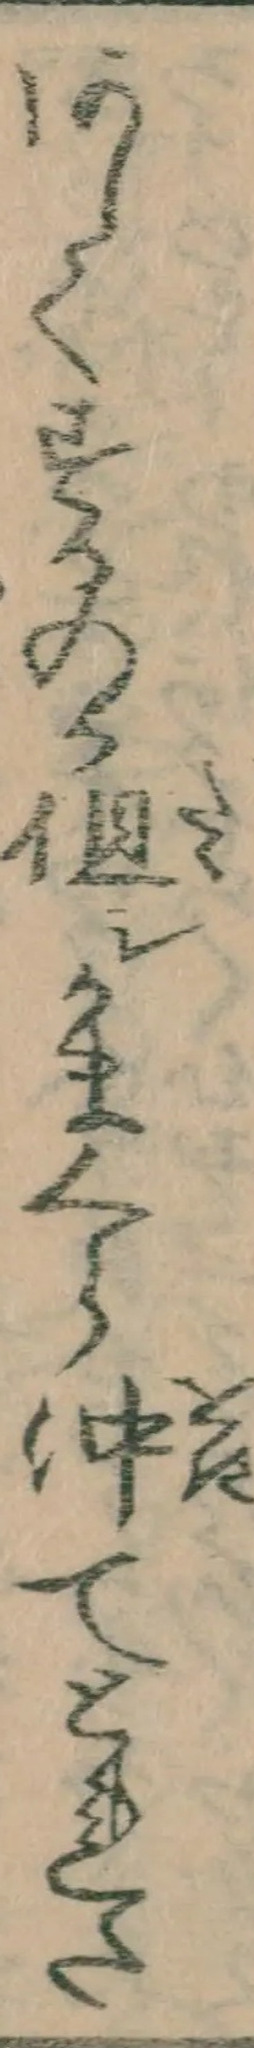あしくするのか但しかまくら沖てとれた
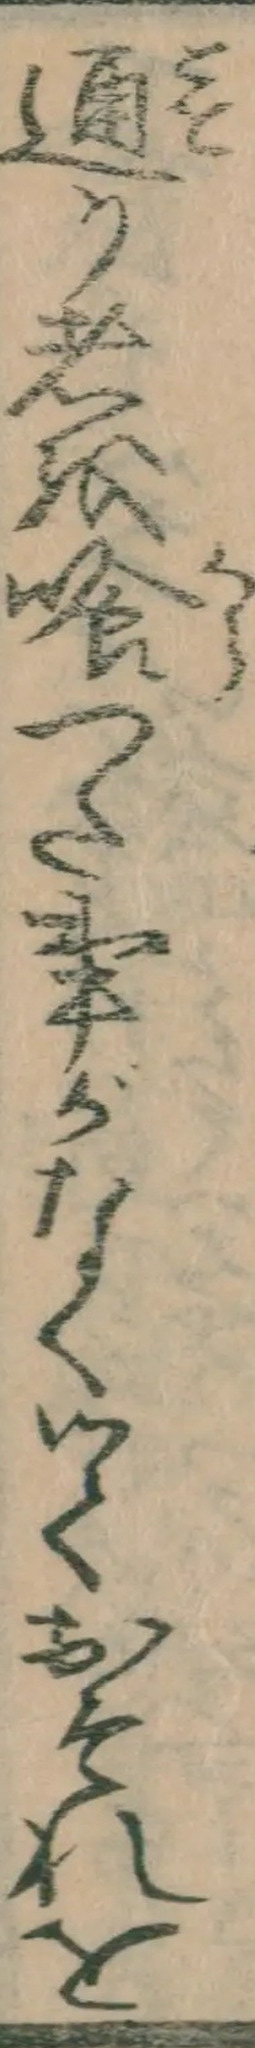通り者を喰つた事がなくつておそれを
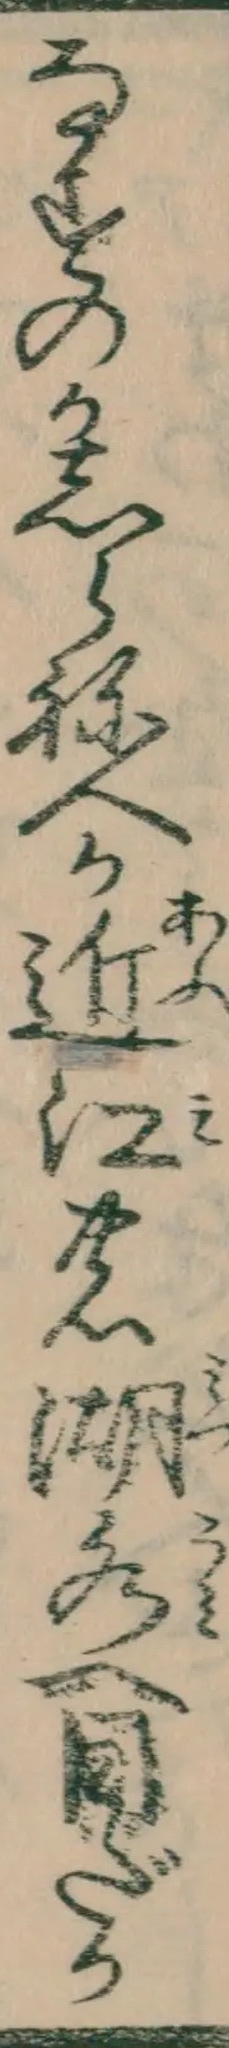なすのかしらねへか近江の湖水へ目だか
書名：教訓読本：大礒風俗仕懸文庫
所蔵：国立国会図書館 National Diet Library, JAPAN
